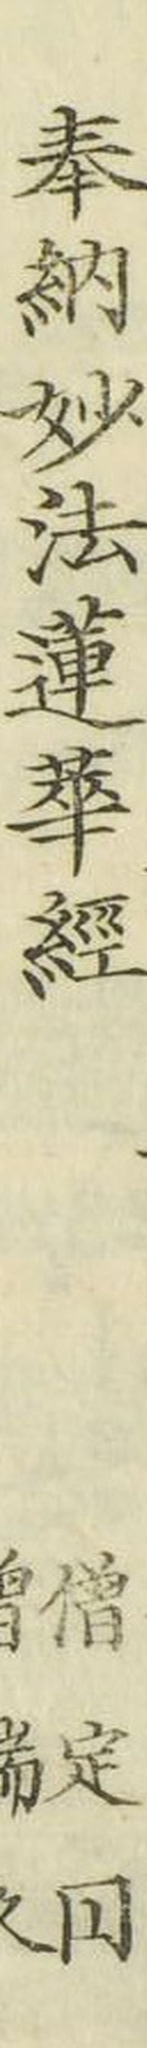奉納妙法蓮華経僧定円
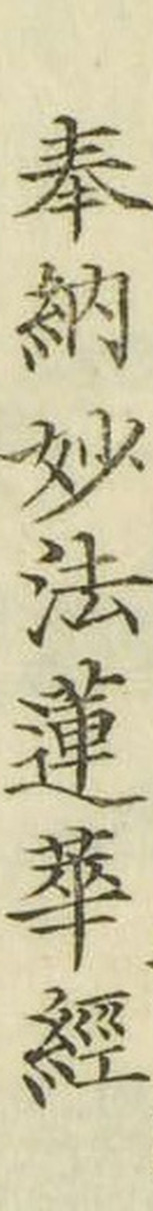奉納妙法蓮華経僧定円
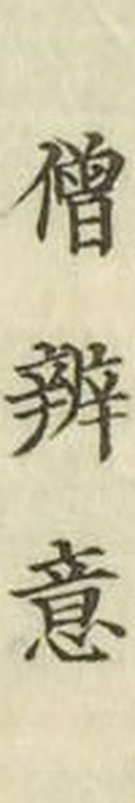僧辨意
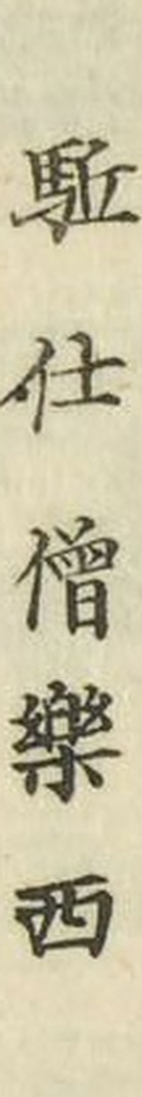駈仕僧楽西
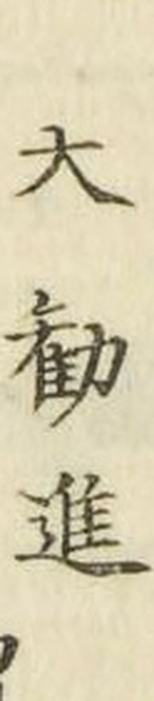大勧進
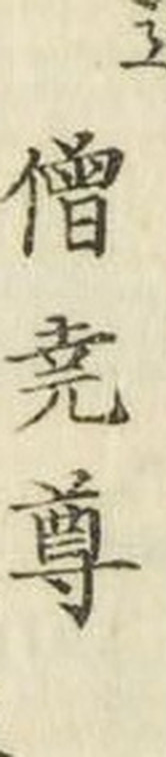僧尭尊
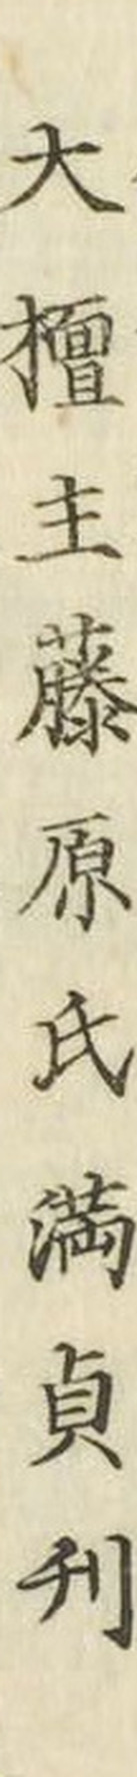大檀主藤原氏満貞刋
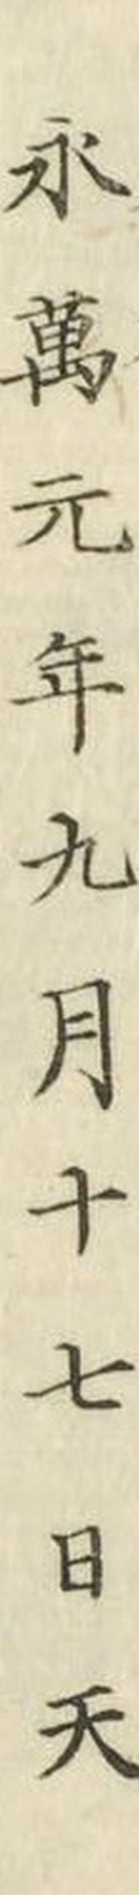永萬元年九月十七日天
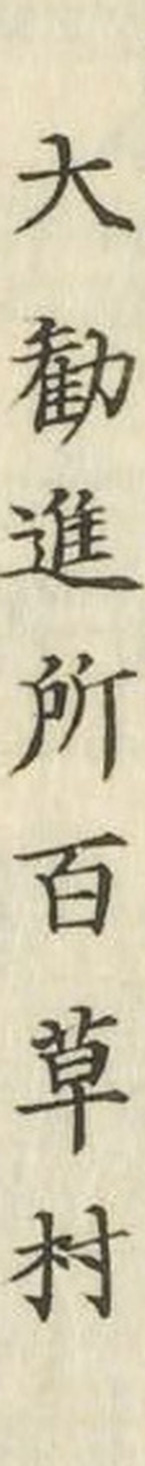大勧進所百草村
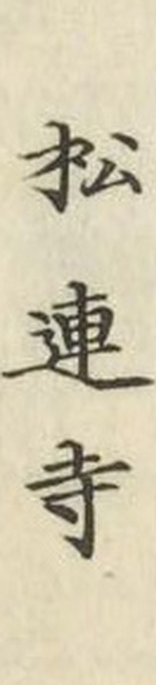松連寺
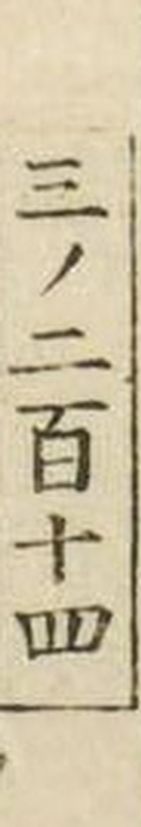三ノ二百十四
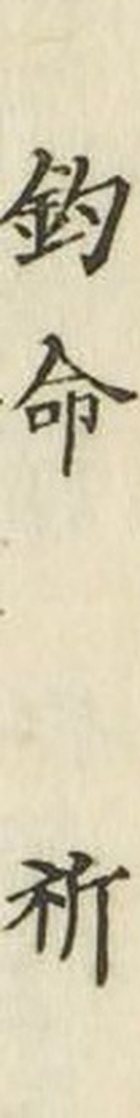釣命祈
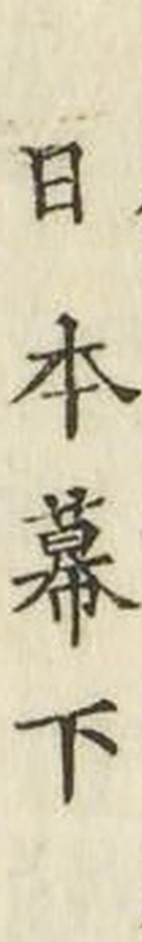日本幕下
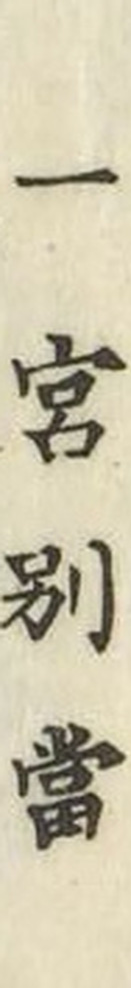一宮別当
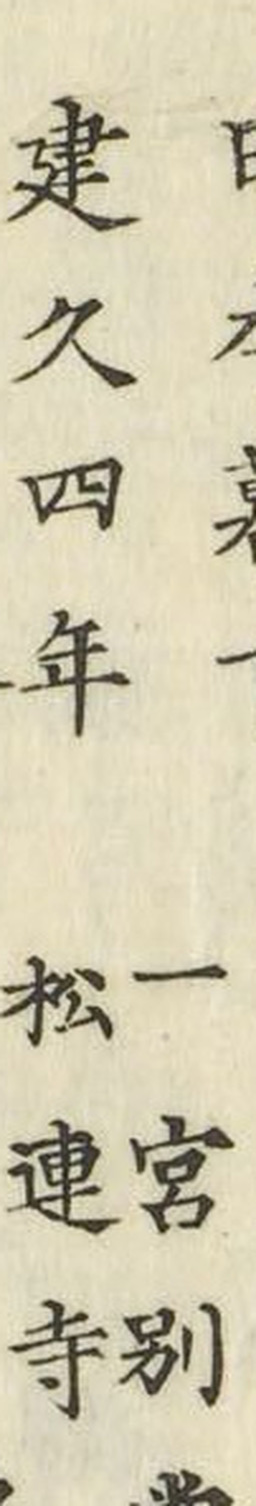建久四年松連寺
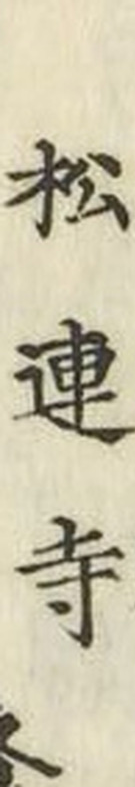松連寺
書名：江戸名所図会 20巻 巻之10
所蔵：東京学芸大学教育コンテンツアーカイブ
